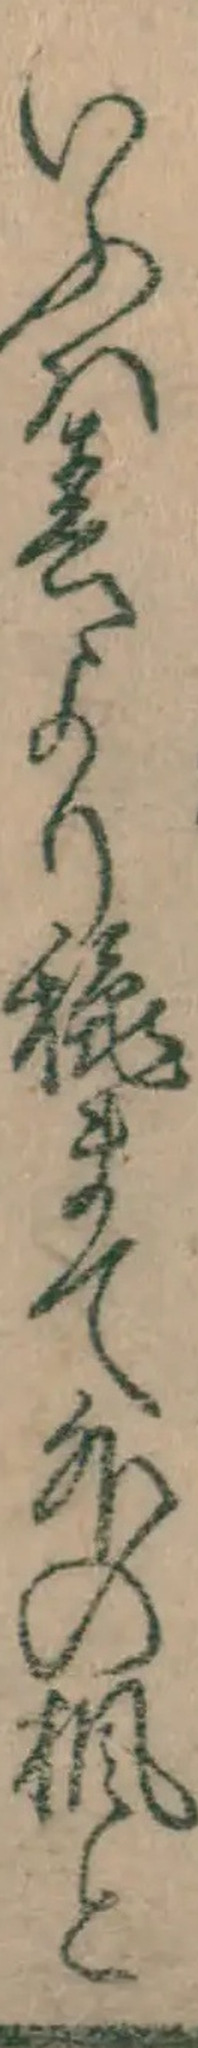いふは春より穐まで外の楓と
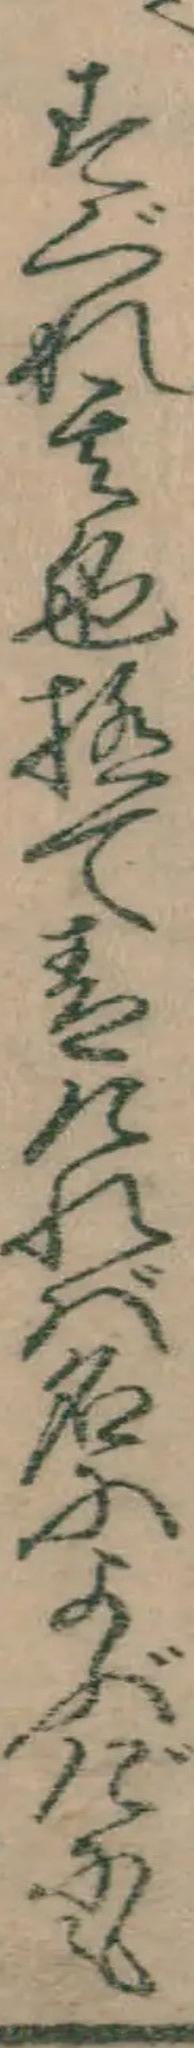すぐれ其色極て青ければ名によぶだにも
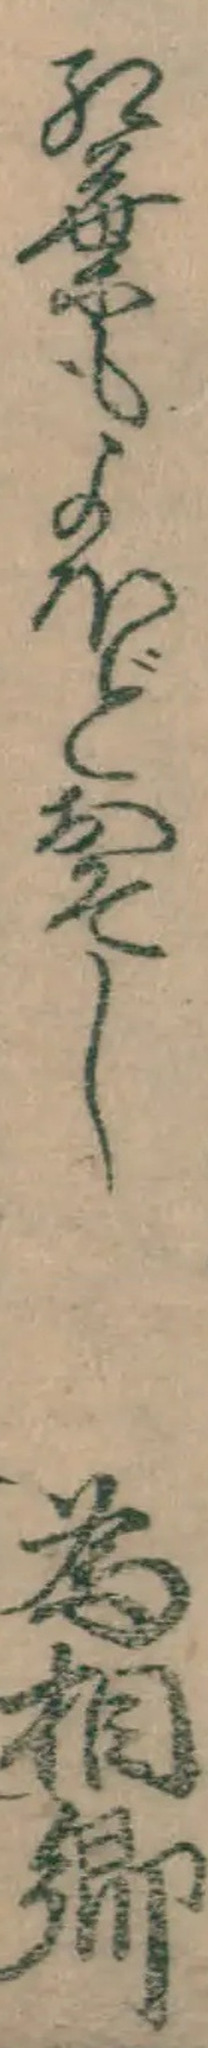紅葉もよほどおそし為相卿
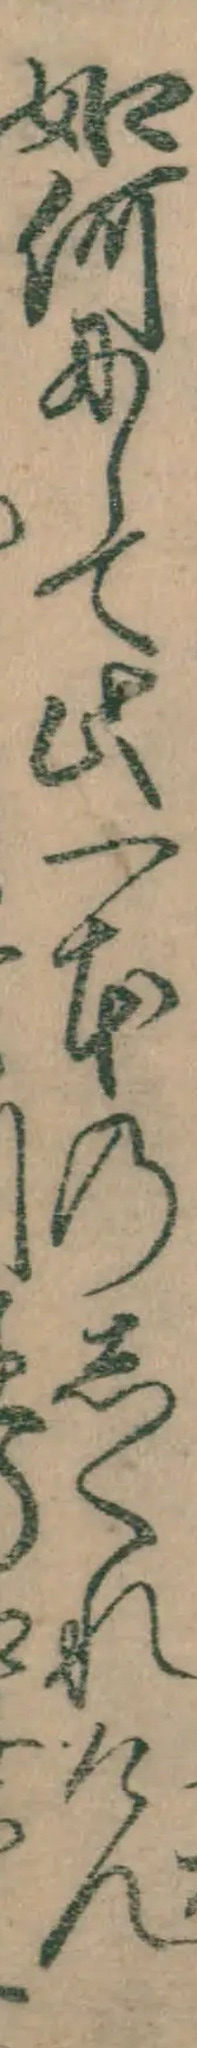如何にして此一本のしくれけん
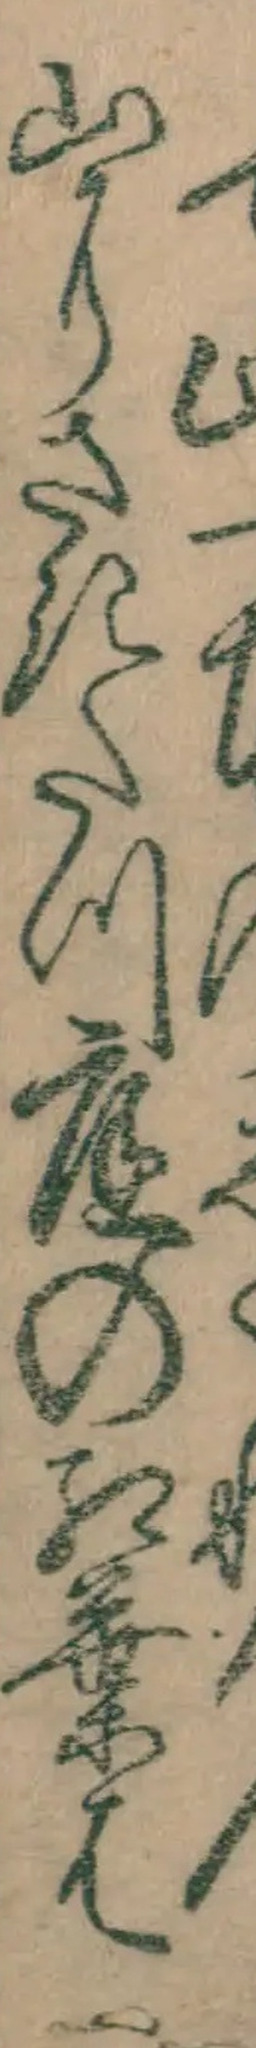山にさきたつ庭の紅葉は

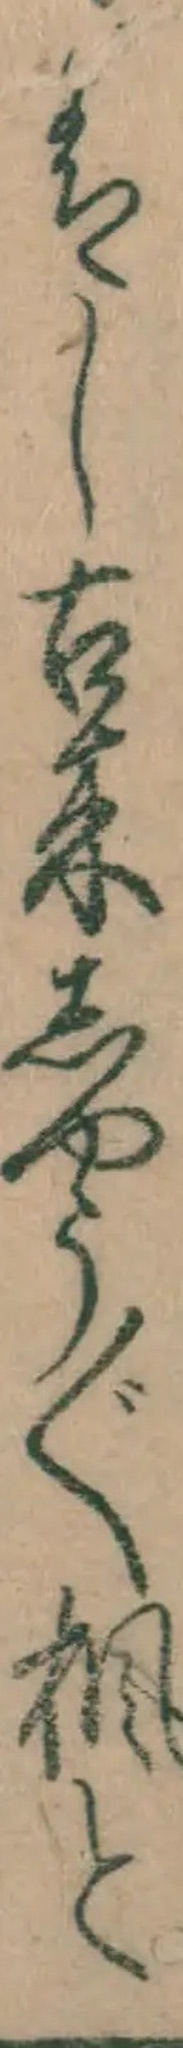青し古来しやう〴〵楓と
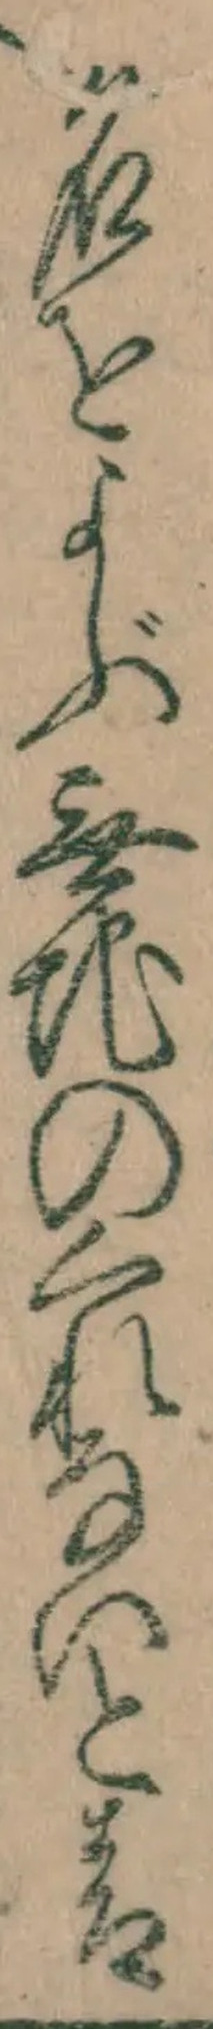名をよぶ無地のくれないと青
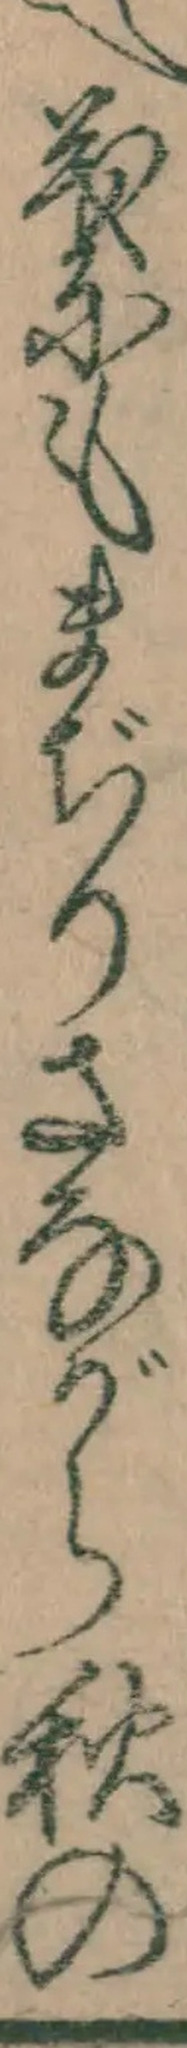葉にもまぢりさながら秋の
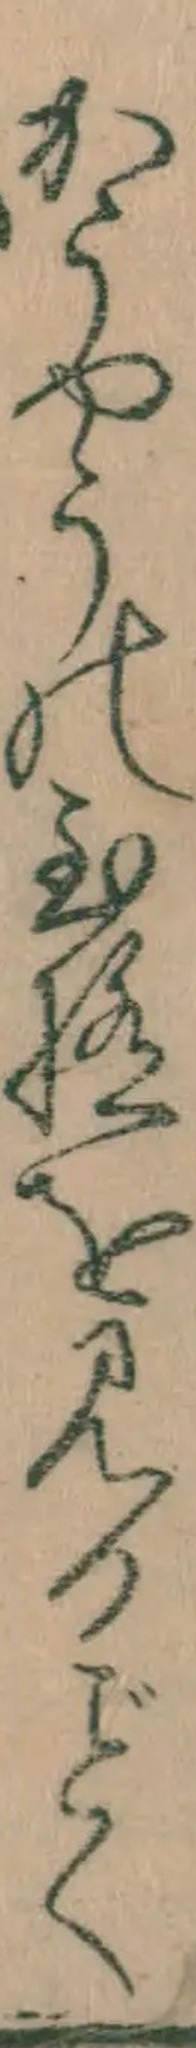かうやうの至極を見るごとく
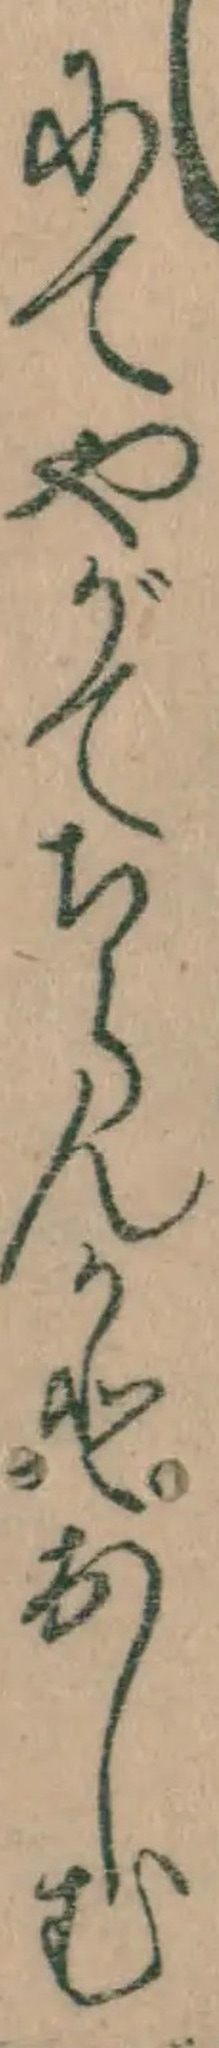にてやがてちらんかとおしむ
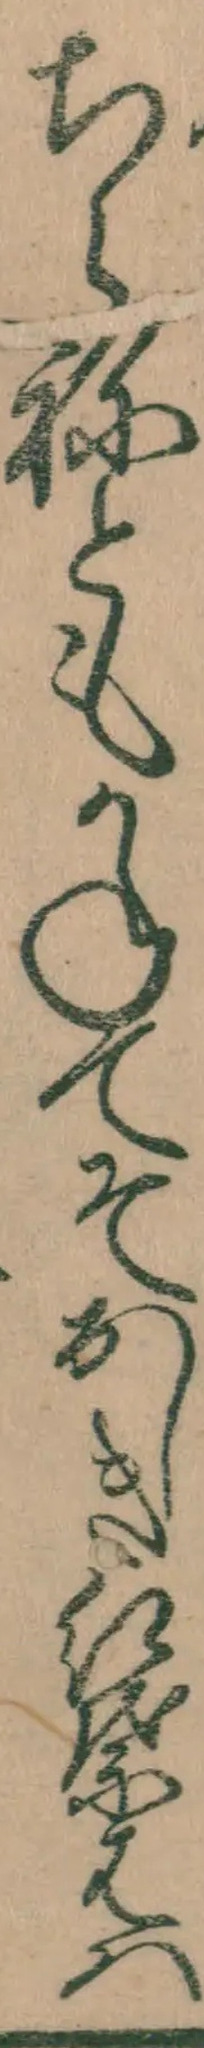ちらねともかねてそおしき紅葉はは
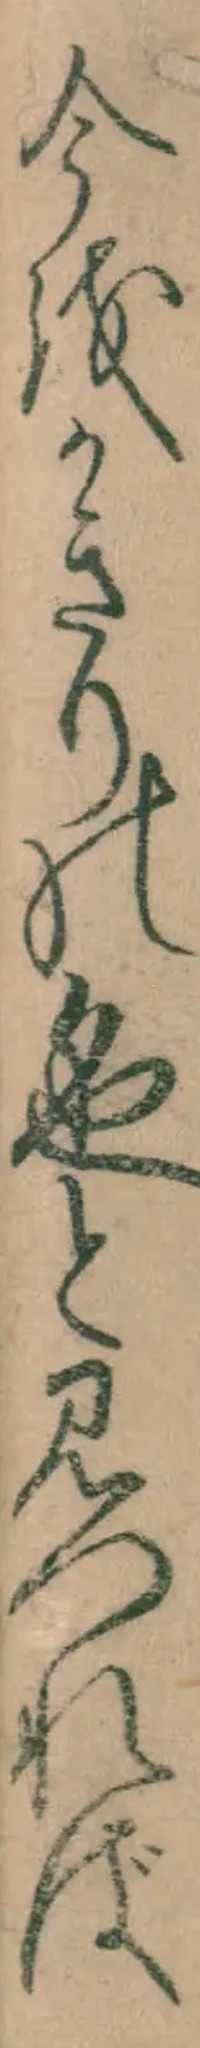今をかきりの色と見つれば
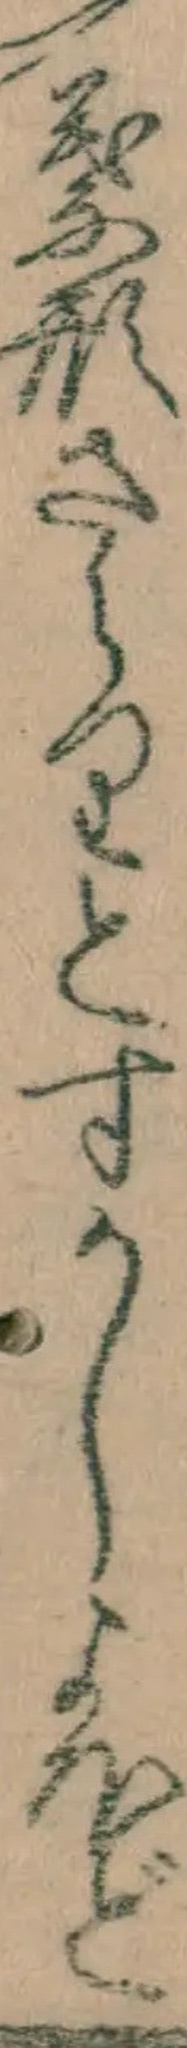葉形さらりとすかしよほど
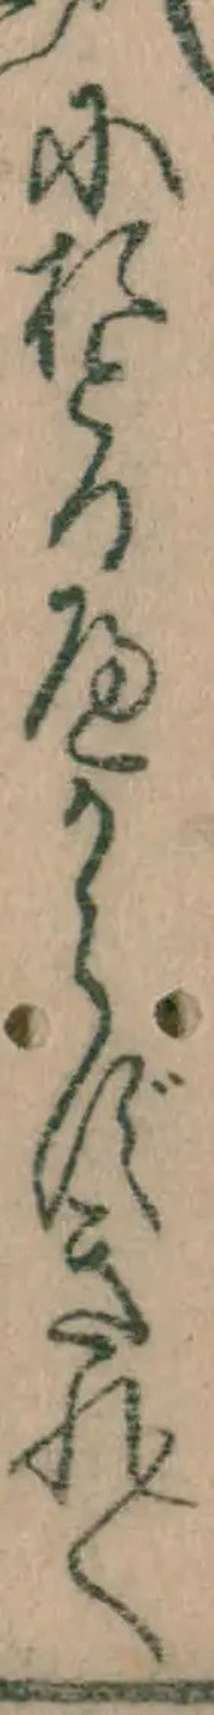におとるへからずきれ〳〵
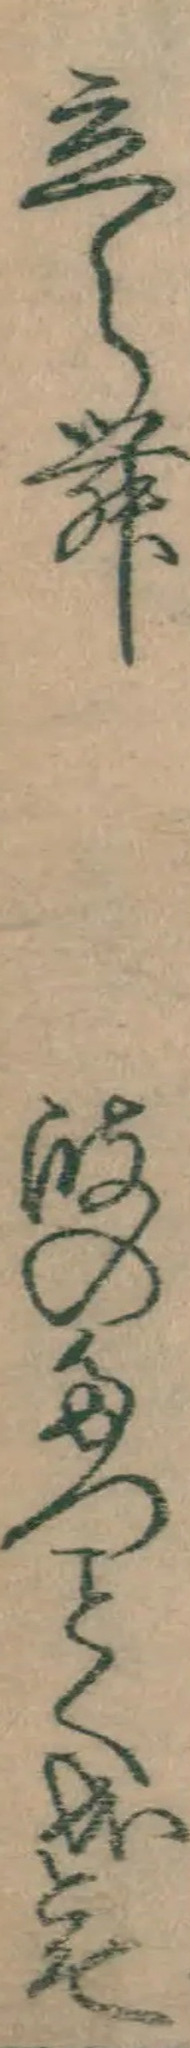立らむ波のたつことく成とそ

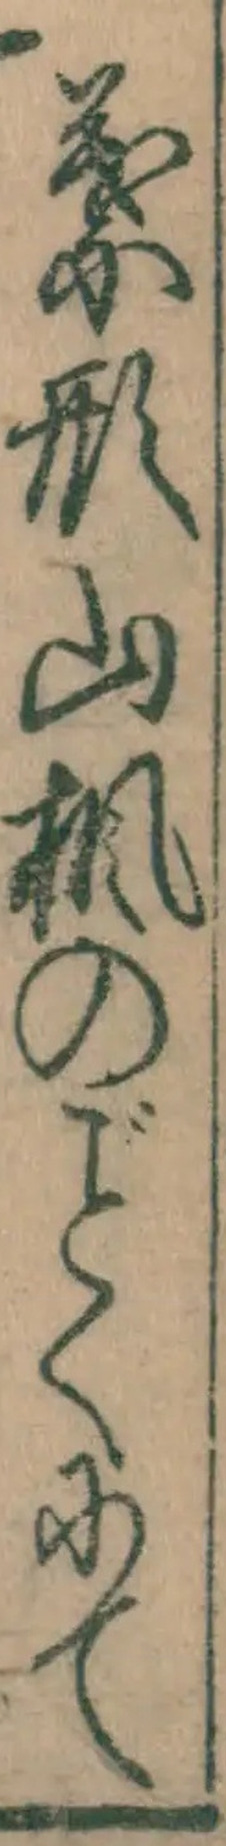紋葉形山楓のごとくにて
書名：紅葉集
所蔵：国立国会図書館 National Diet Library, JAPAN
